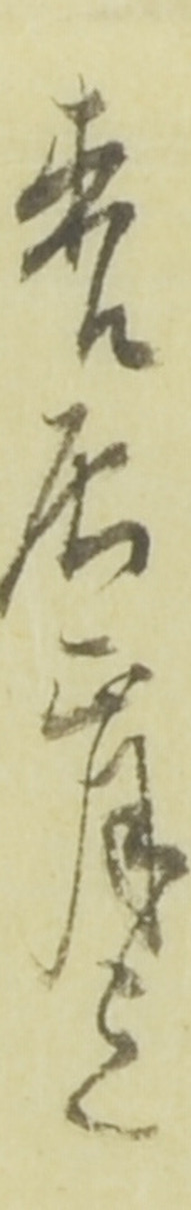来ル辰正月迄
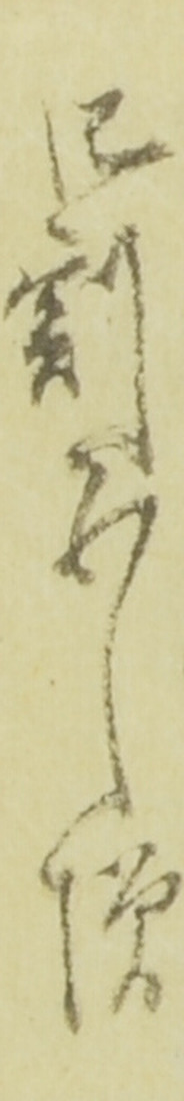四割五分増
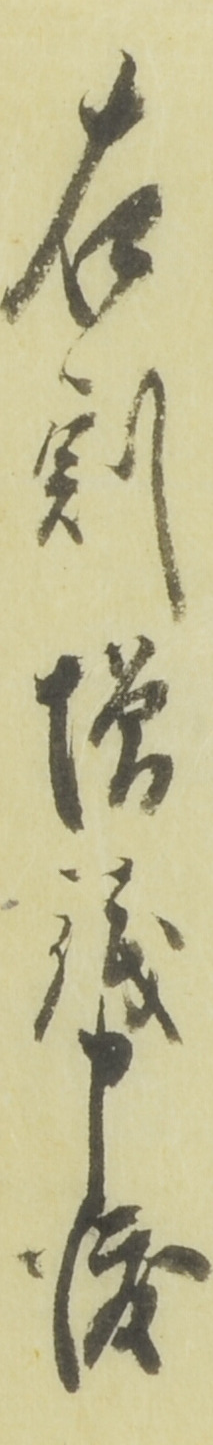右割増銭申渡
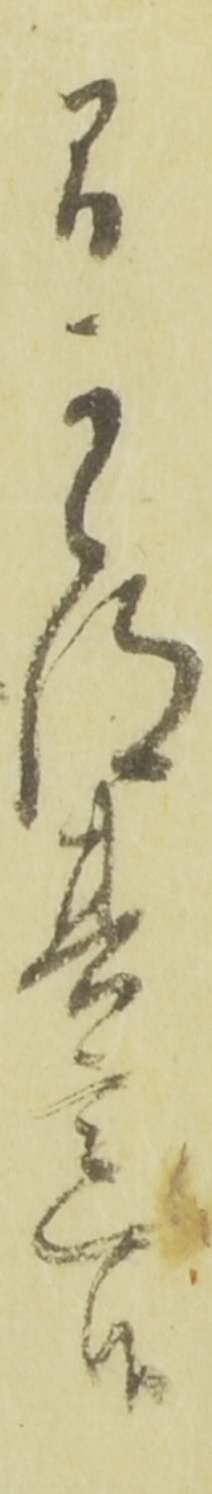間可得其意候
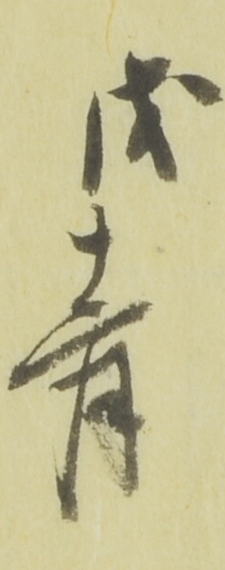戌十二月
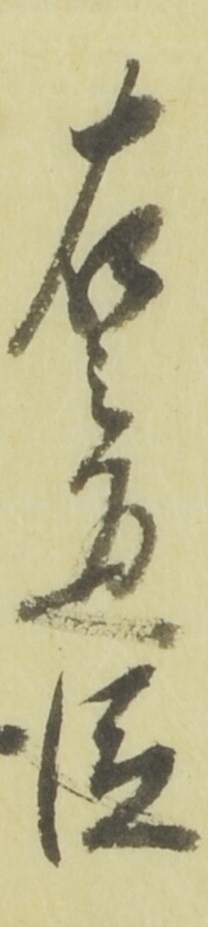右之通従
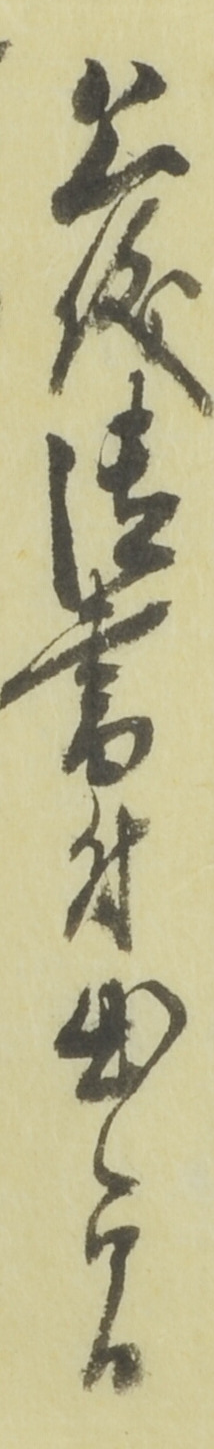公儀御書付出候間
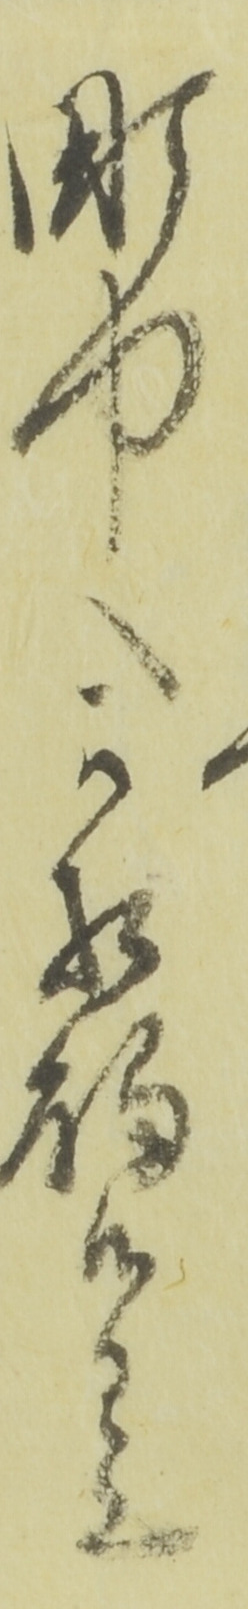町中へ可相触候已上
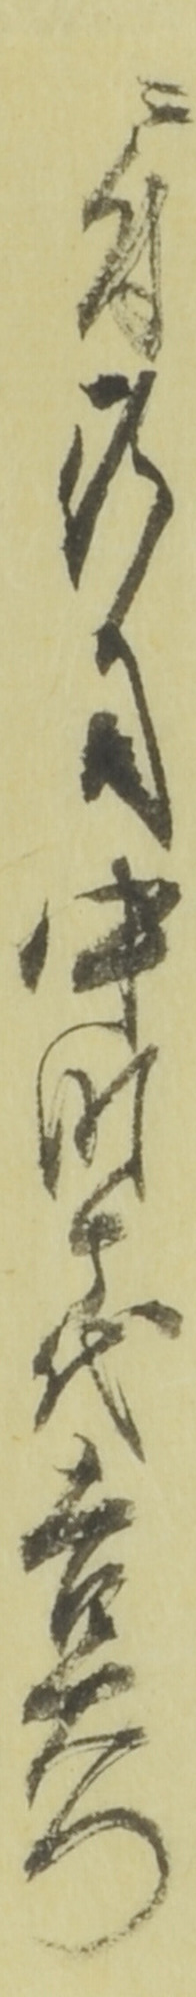ニ付行司中町中丁代吉右衛門
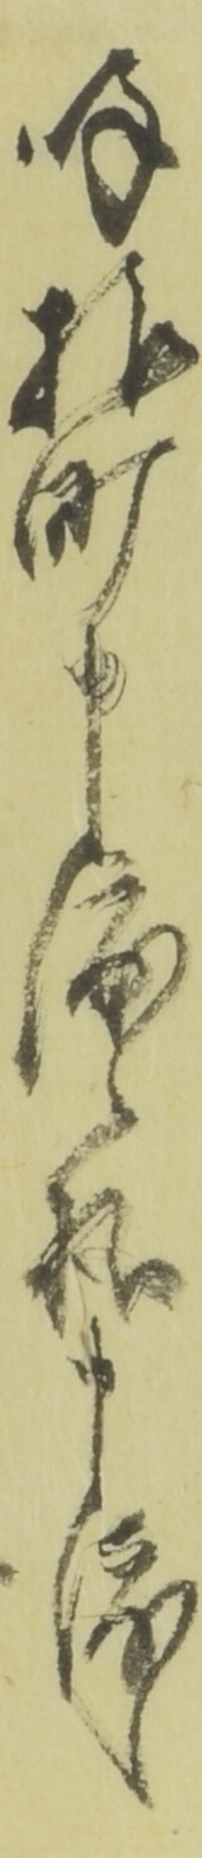呼様町申渡候様申渡候
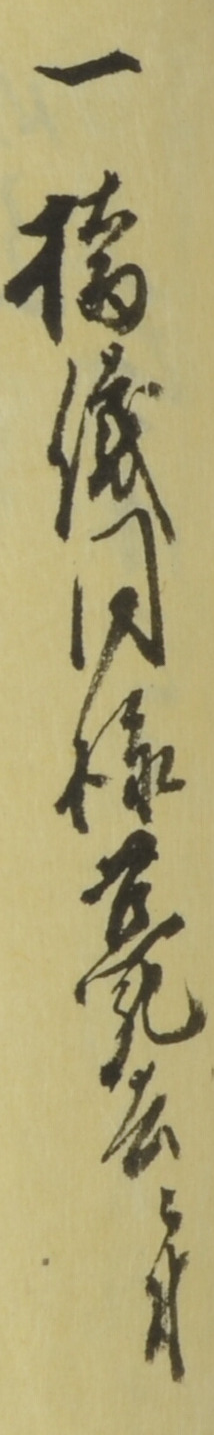一橋儀同様薨去ニ付
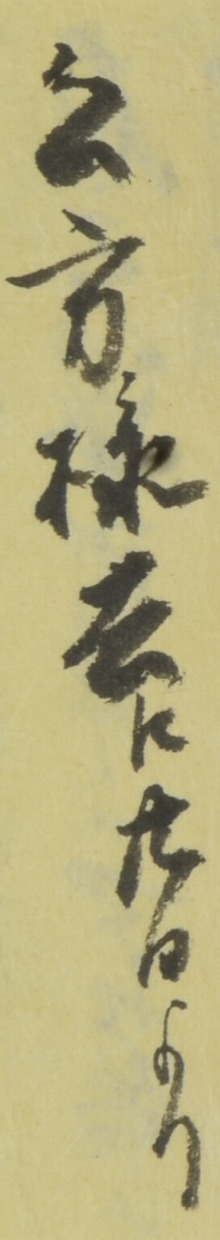公方様去ル廿日より

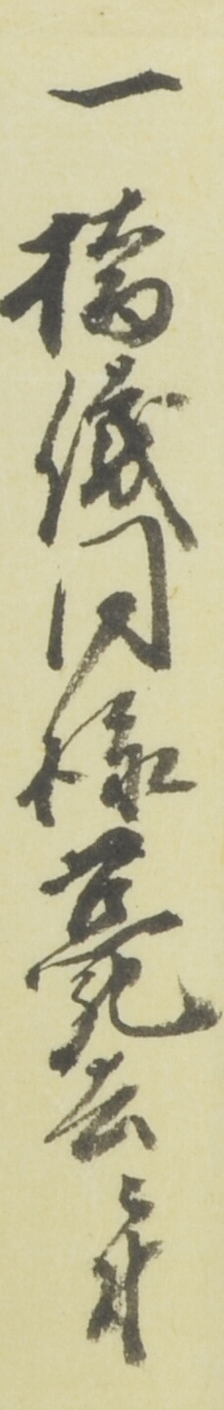一橋儀同様薨去ニ付
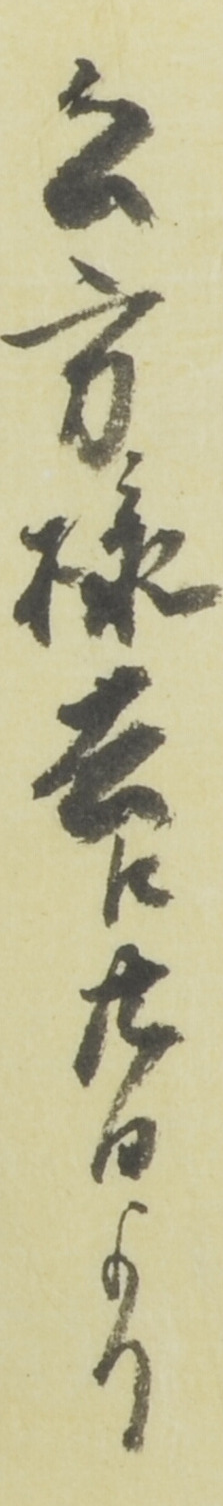公方様去ル廿日より
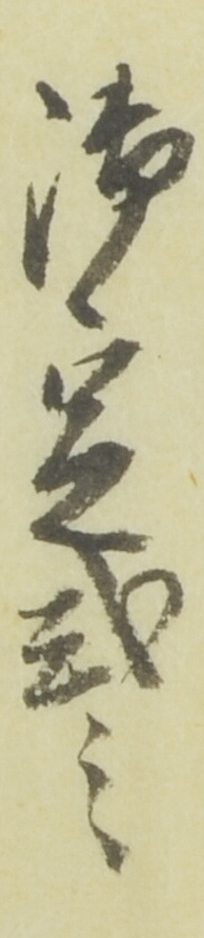御定式之
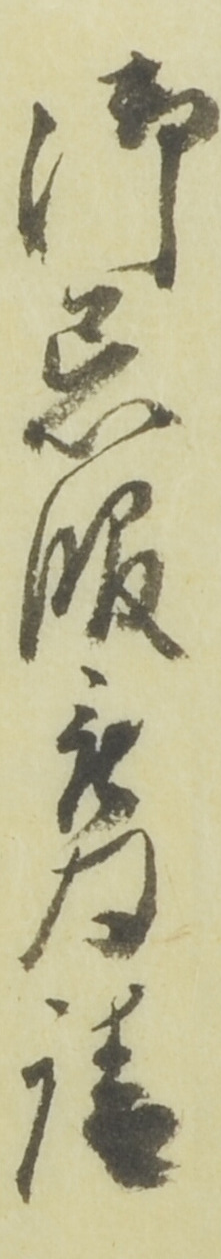御忌服被為請
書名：御触書御書附控
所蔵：伊那市立高遠町図書館・合同会社AMANE
